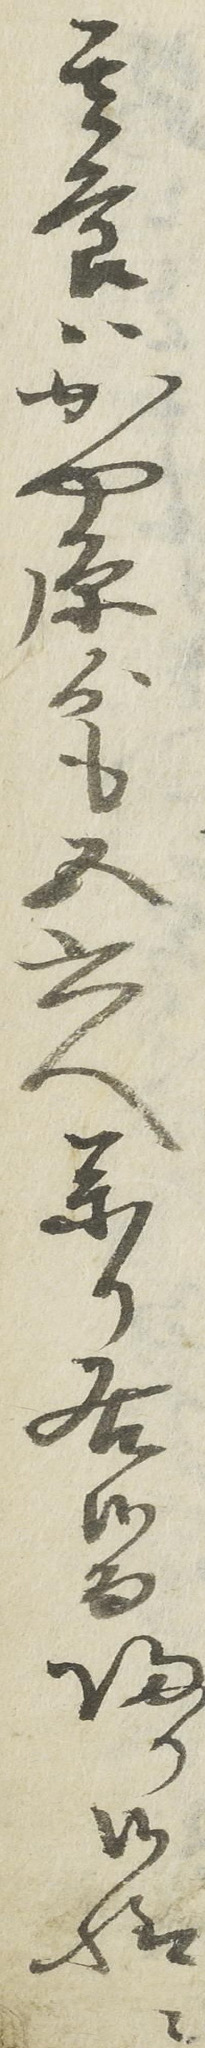其節はかゆ原ゟも五六人参り居候而帰り候様二

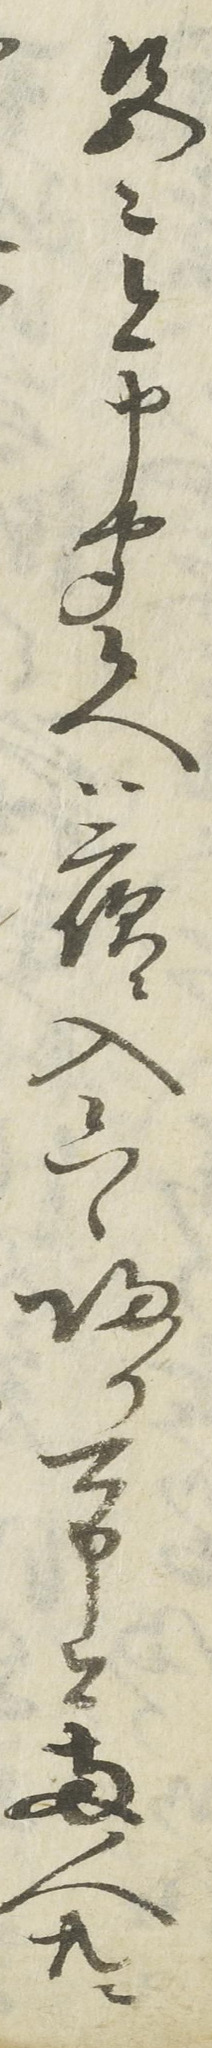色〻と申聞候ヘは夜ニ入候はヽ帰り可申と両人共ニ
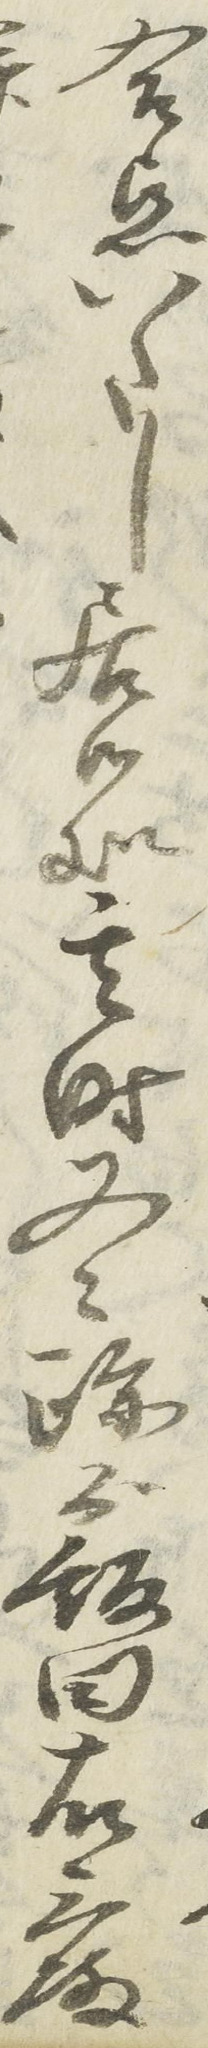合点いたし居候処其時又〻跡ゟ飯田右三殿
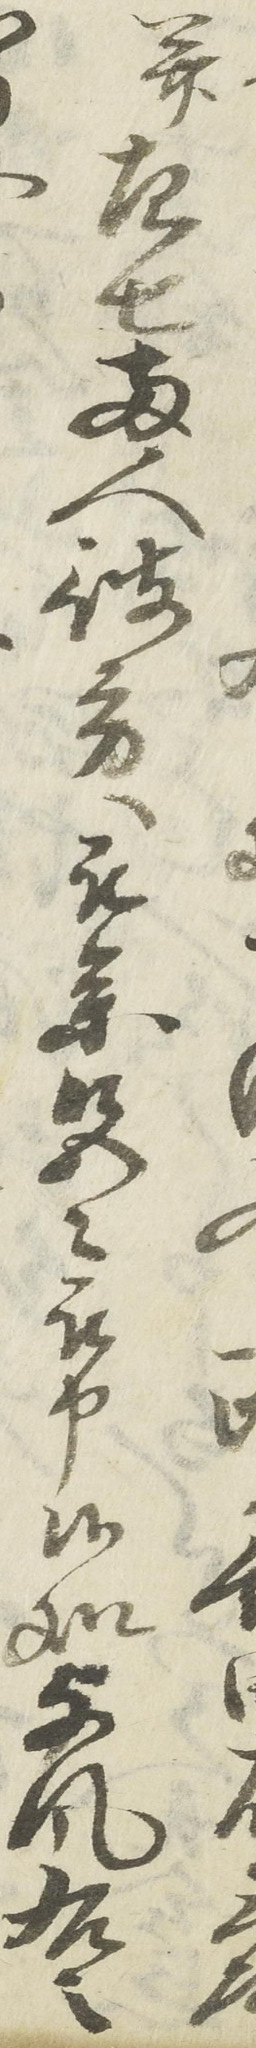幷左七両人彼方ヘ被参色〻被申候処与風右之
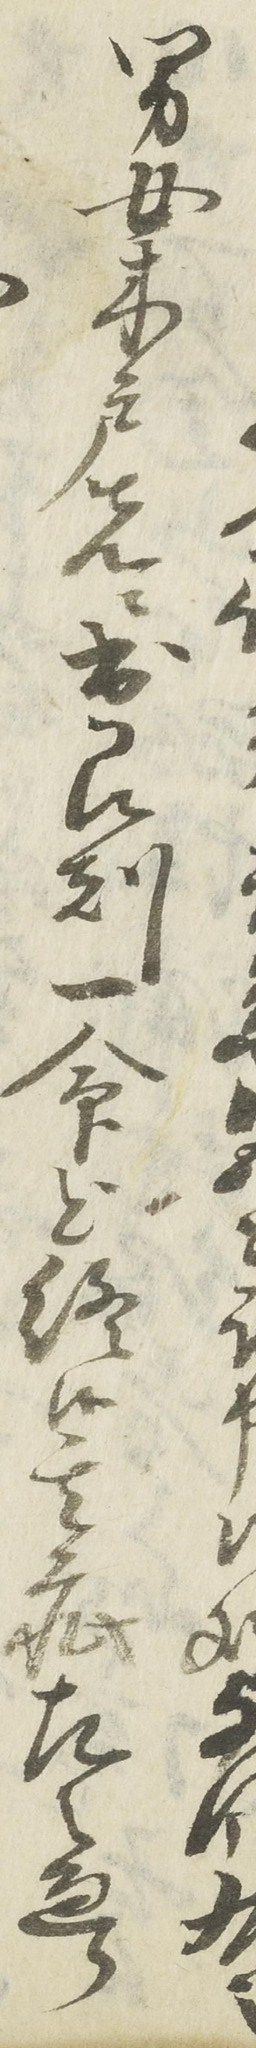男女木戸先ニ出即刻一命を終候其疵左之通り
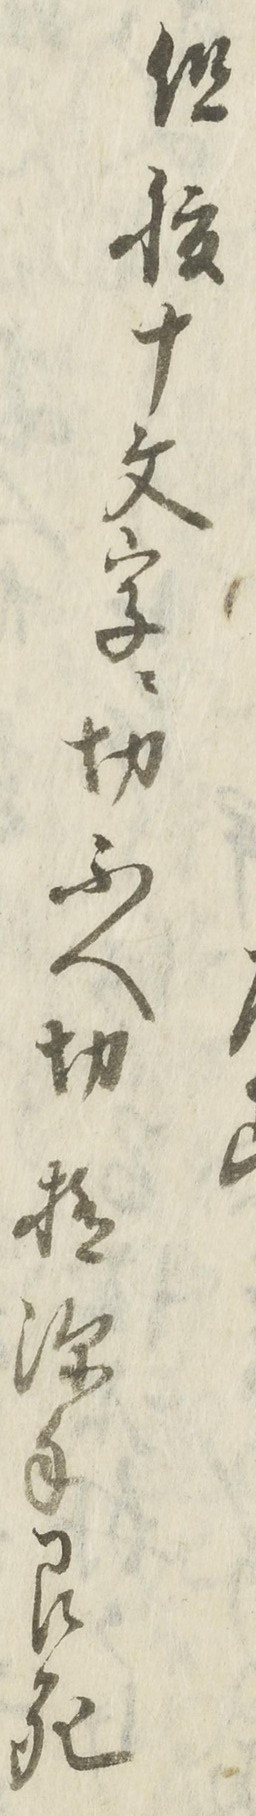但腹十文字ニ切ふへ切極深手即死
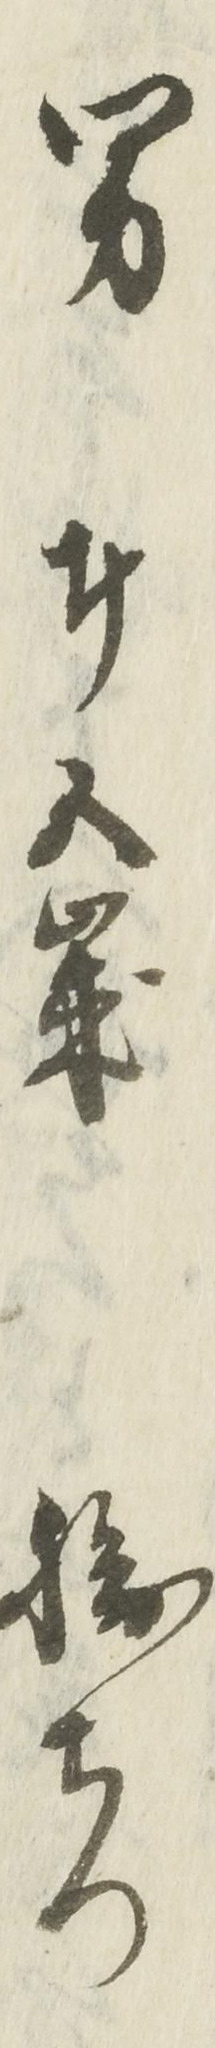男廿五歳勝右衛門
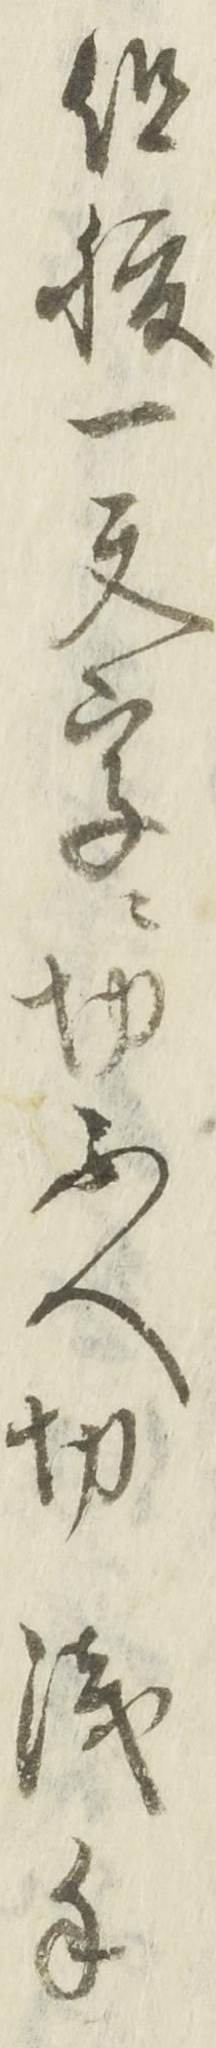但腹一文字ニ切ふへ切浅手
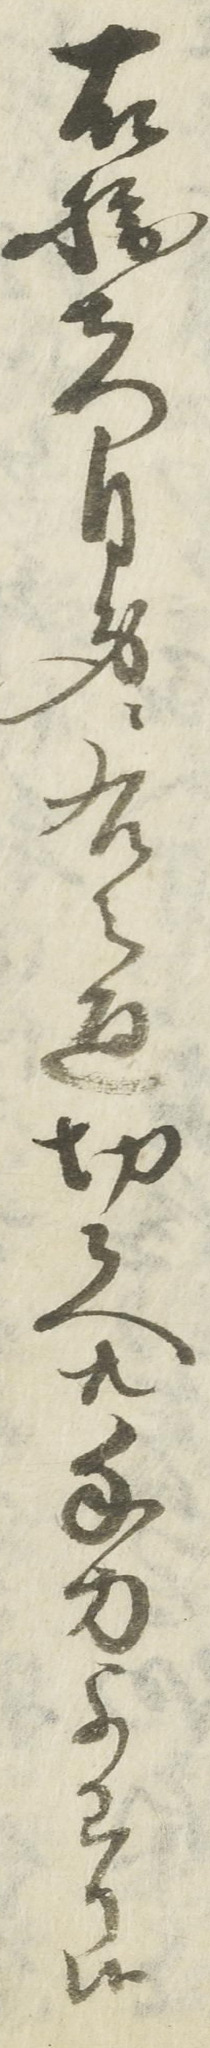右勝右衛門自身ニ右之通切候へ共手力よわり候
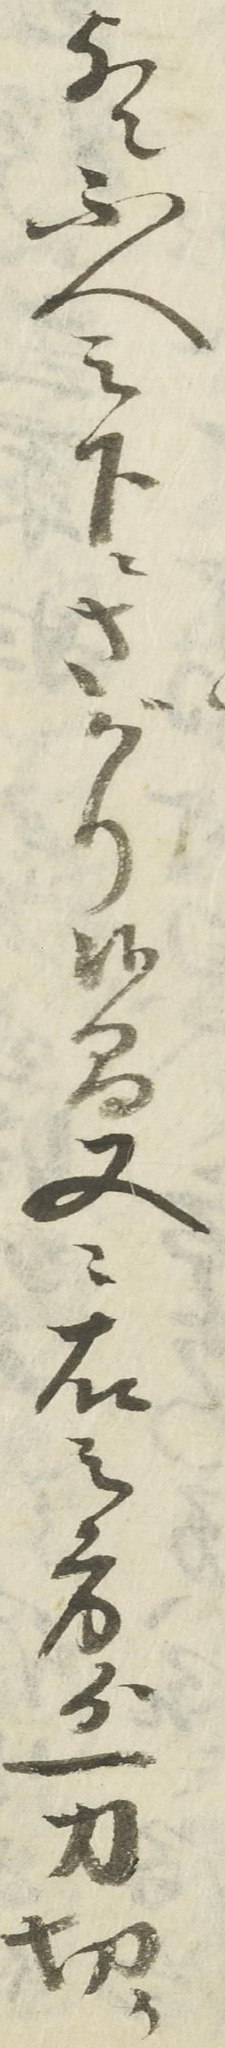歟ふへ之下ニさがり候間又〻右之方ゟ一刀切り
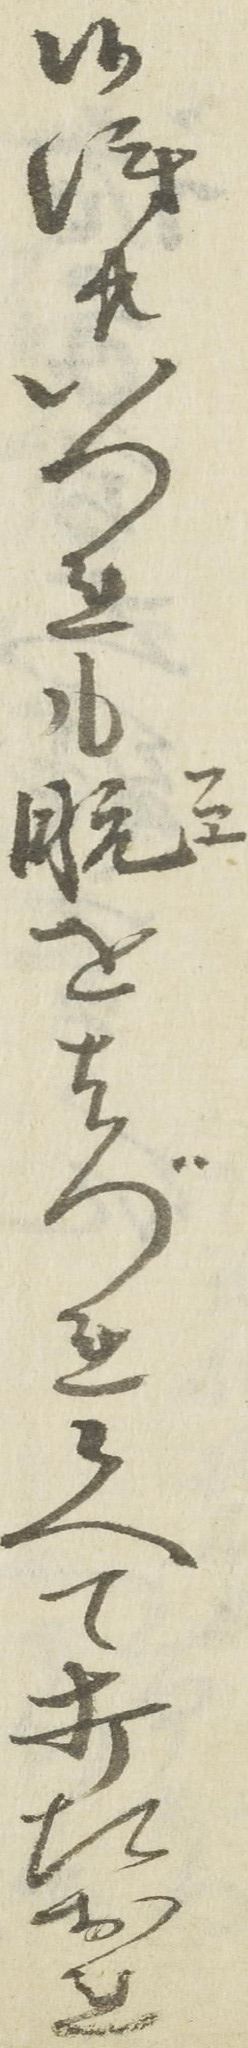候得共いつれも脱をはづれ候へて打たおれ
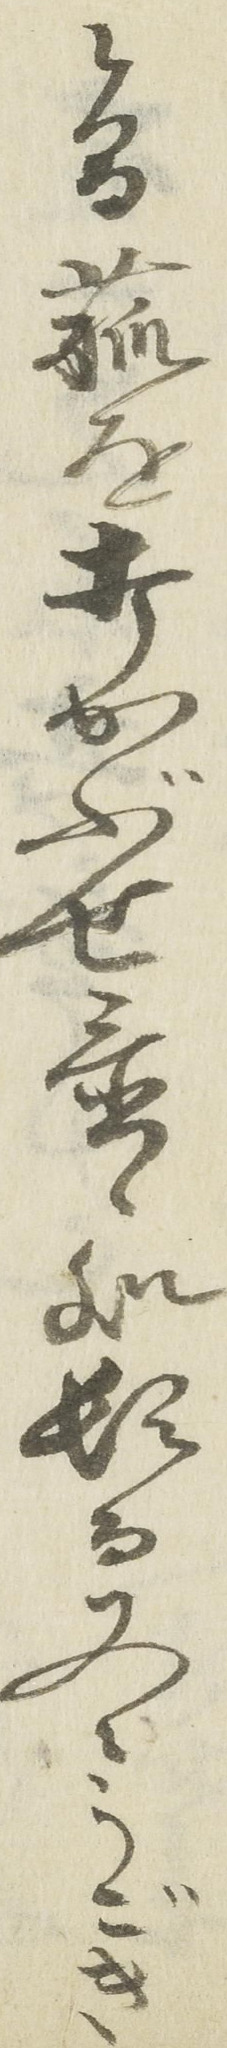候間菰を打かぶせ置候処軈而又〻うごき
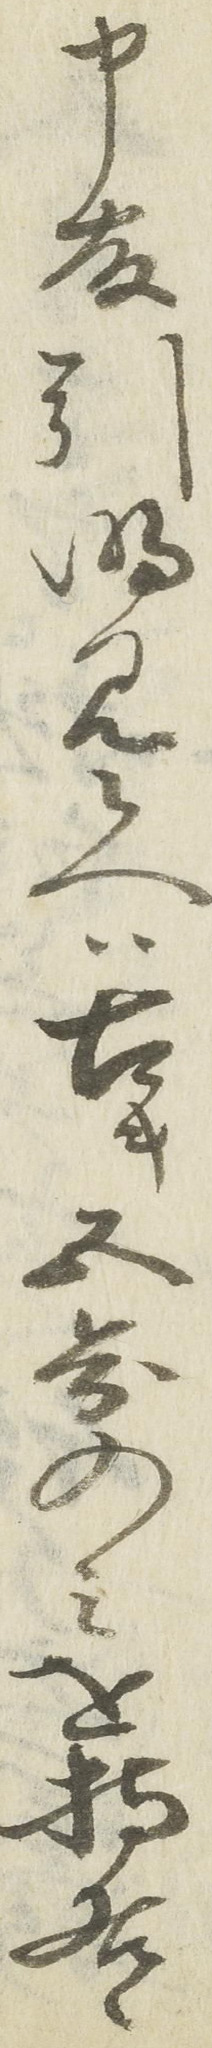申故引明見候へは古き五歩のみを持居候
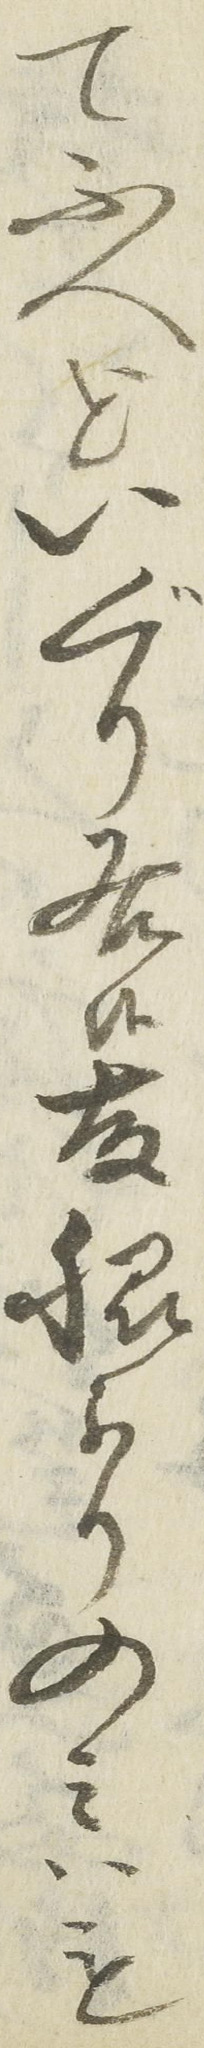てふへをいぐり居候故脇よりのみはも
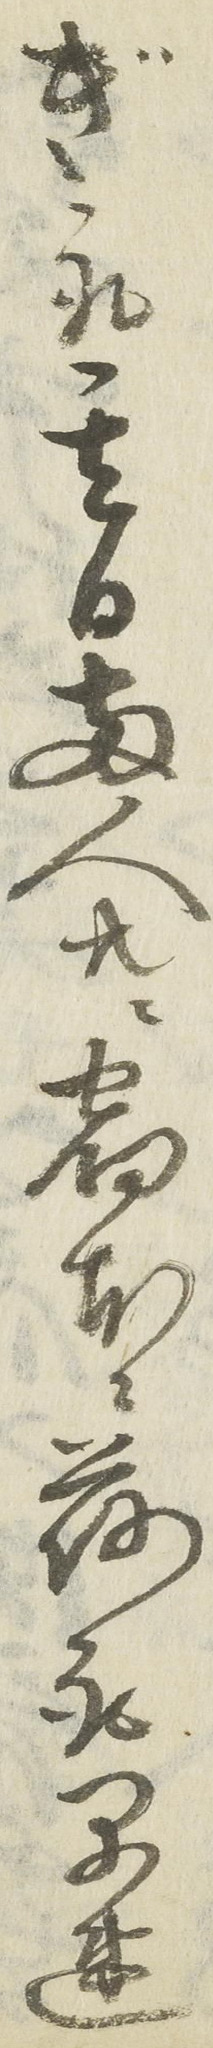ぎ取其日両人共ニ宿本ニ落取早速
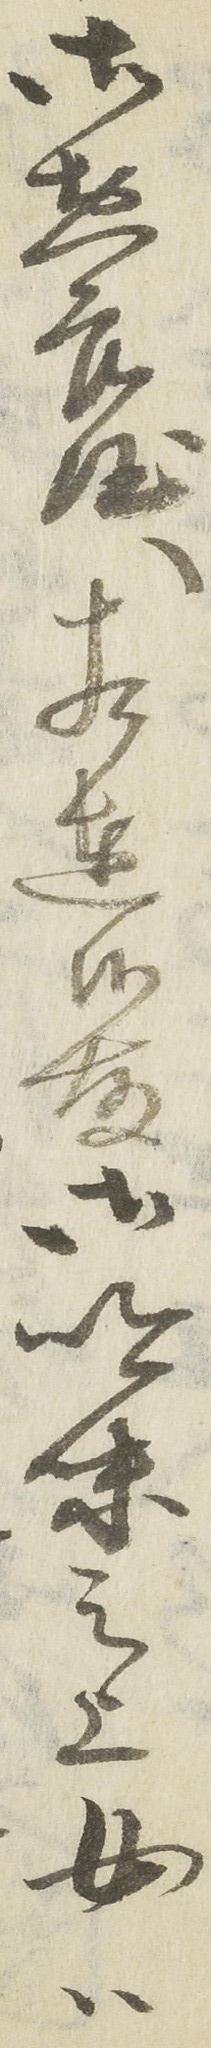御惣庄屋ヘ相達候故御吟味之上女は
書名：後見笑
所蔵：東京大学地震研究所図書室 Earthquake Research Institute Library, The University of Tokyo, JAPAN
